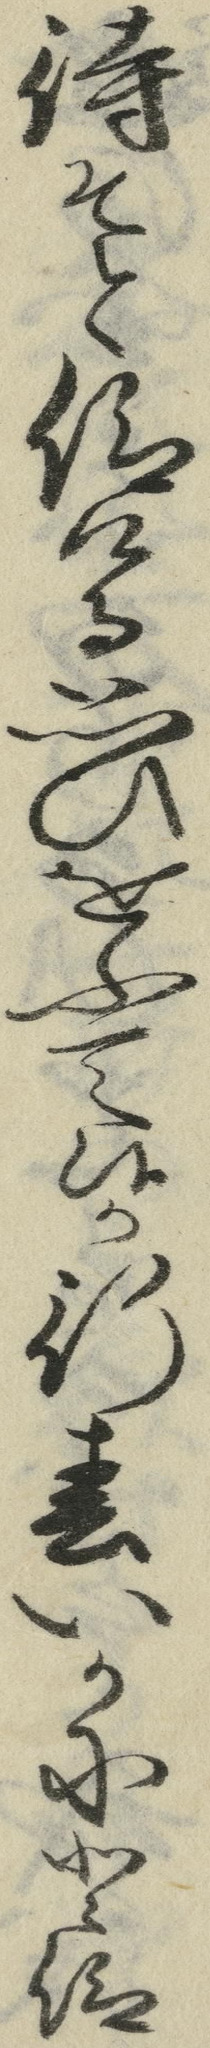待そと仰ける思ひをふて候か行春いかにと仰
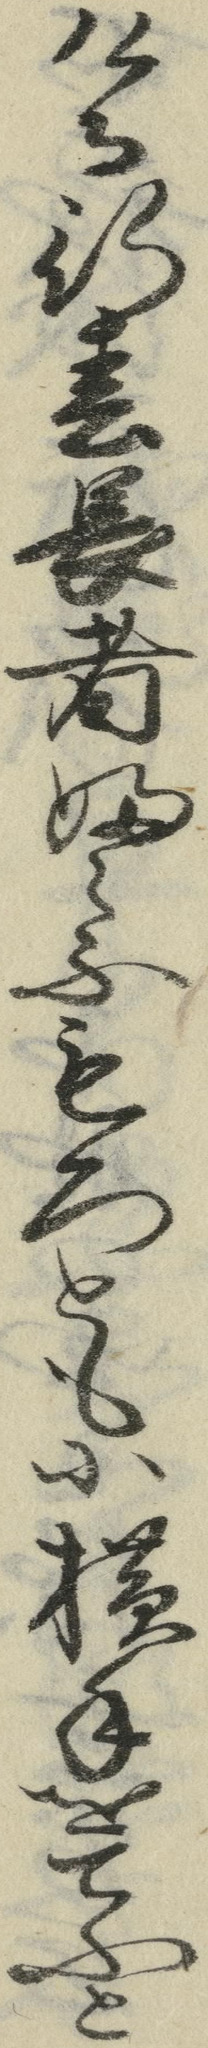ける行春長者ふうふもろともに横手をてふと
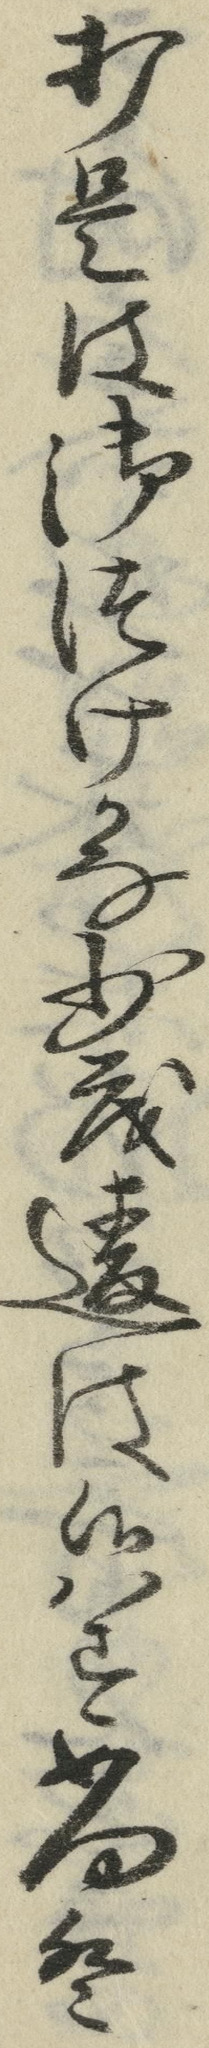打是は御つけかな少も違は候はす如何は
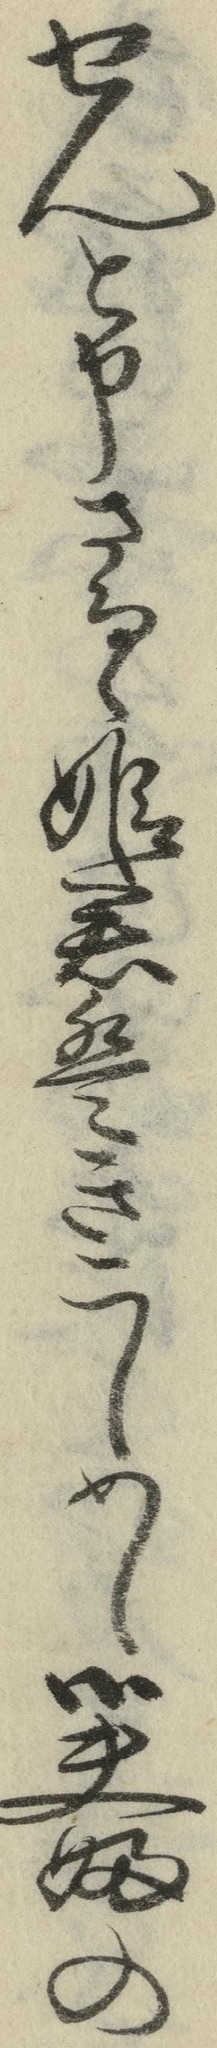せんと申さるゝ姫君はきこしめし御夫婦の
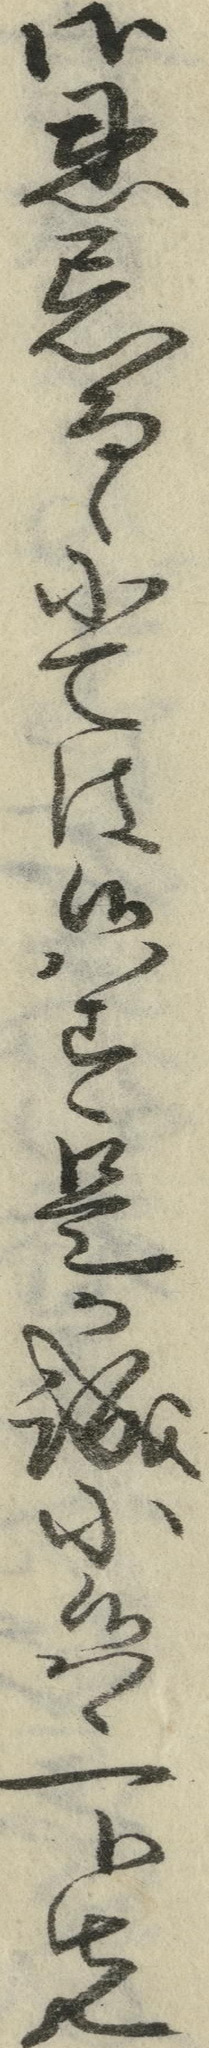御恩忘るゝにては候ハす是か誠に候ハゝ一ト先
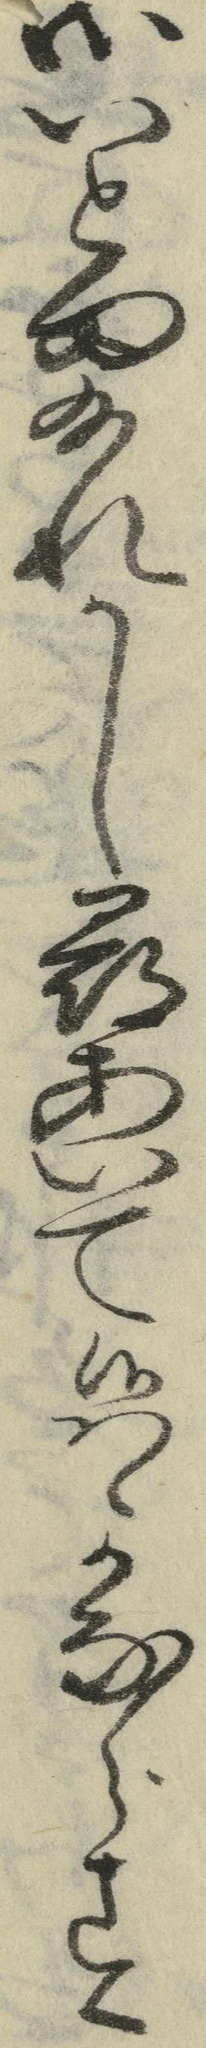御いとま給れかし尋あいて候ハゝかならす
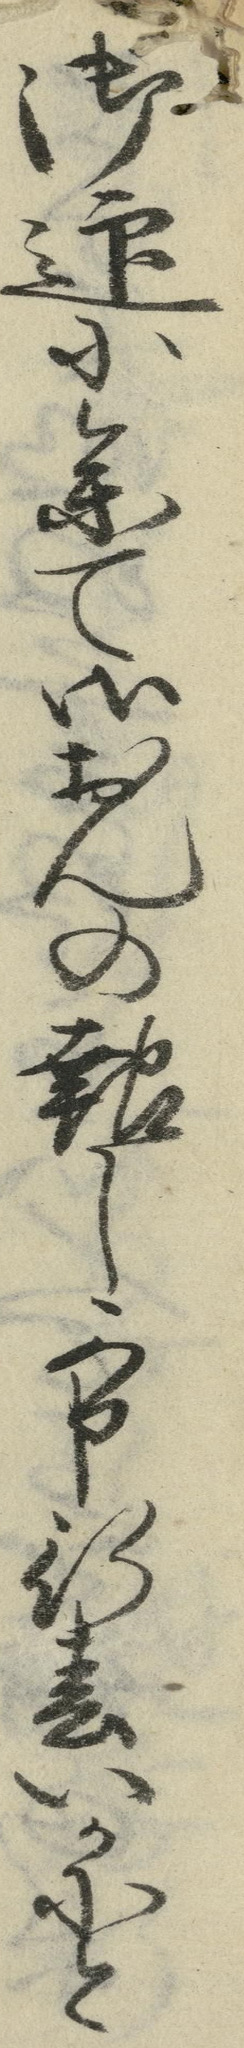御迎に参て御おんの報し可申行春いかにと
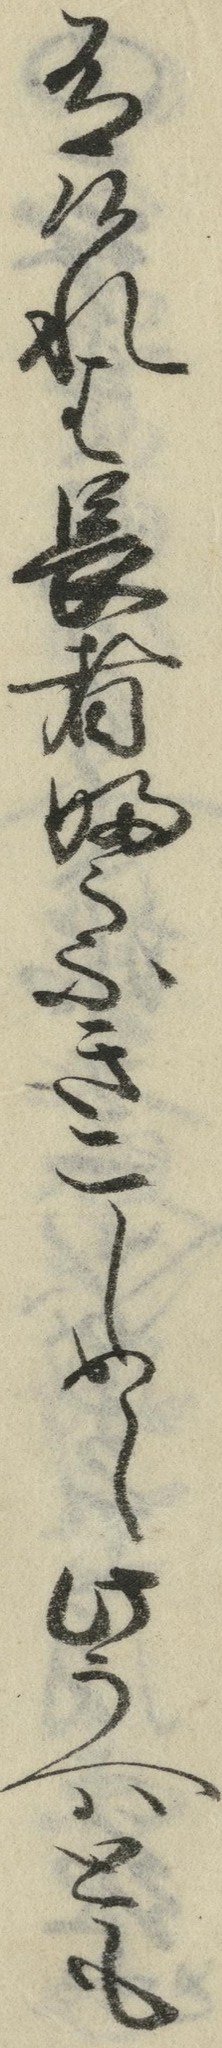有けれは長者ふうふきこしめし此うへハとも
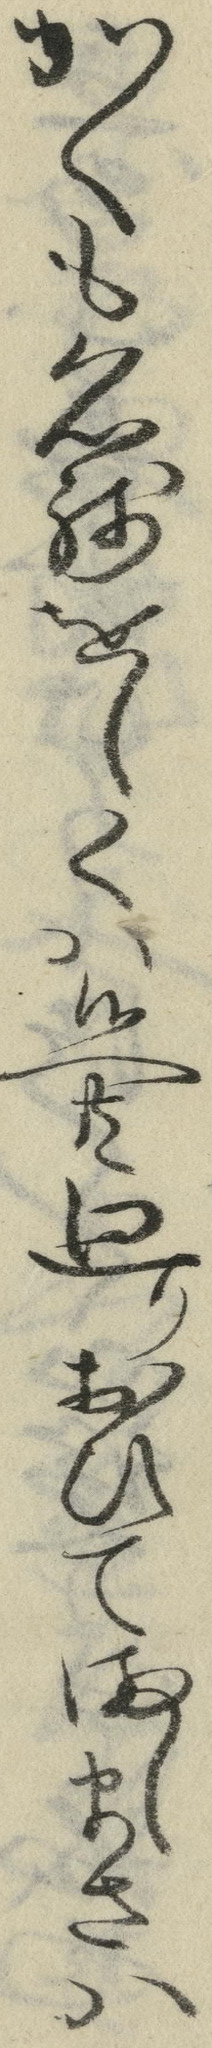かくも名残をしくハ候へ共廻りおひてましまさハ
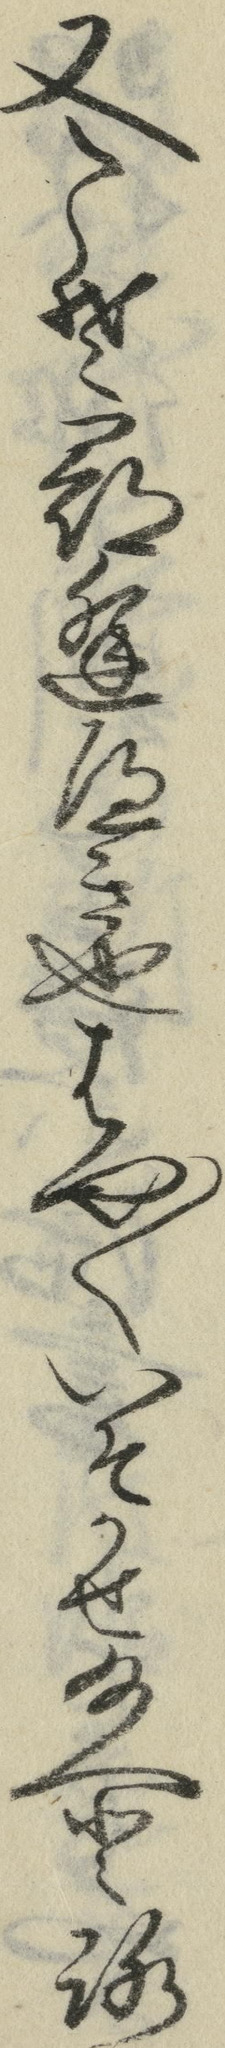又こそ尋逢へき也はや〳〵いそかせ給へと路
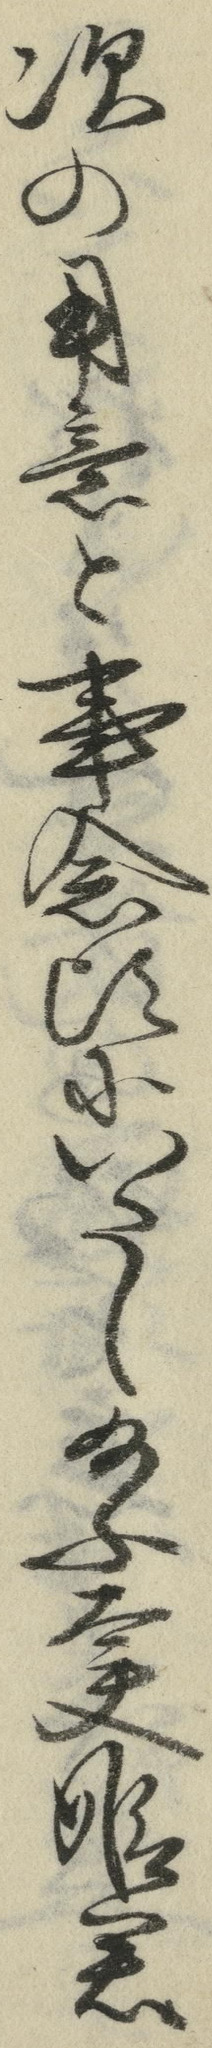次の用意と事念頃にいたし給ふ太夫姫君
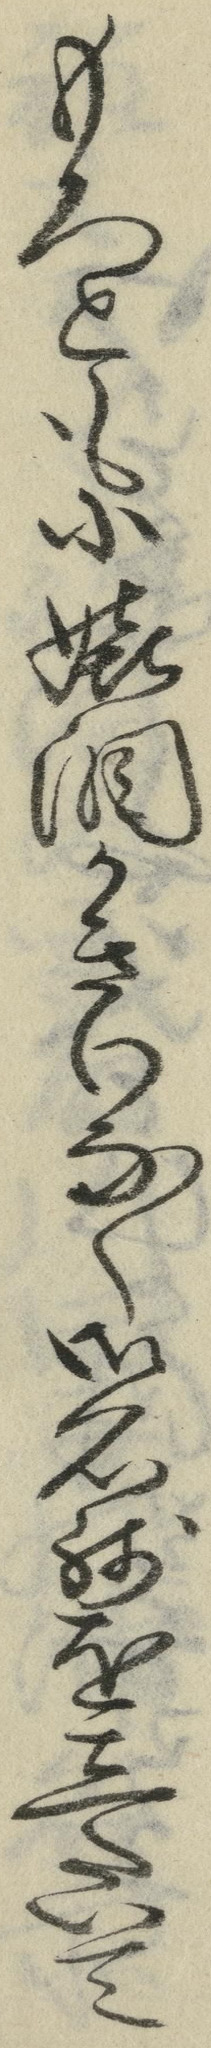もろともに嬉泪かきりなく御名残をしたいて
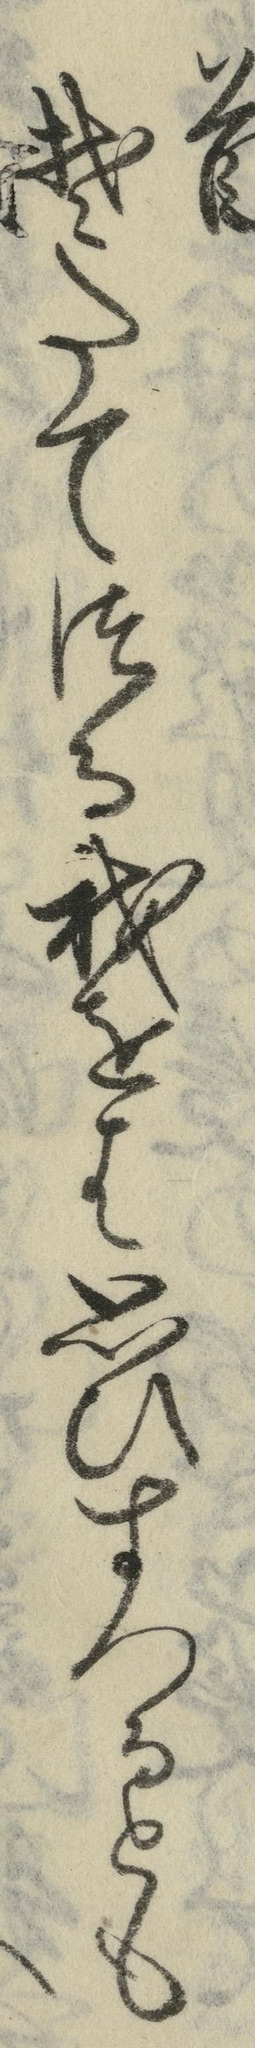そたてつる我をは思ひすつるとも
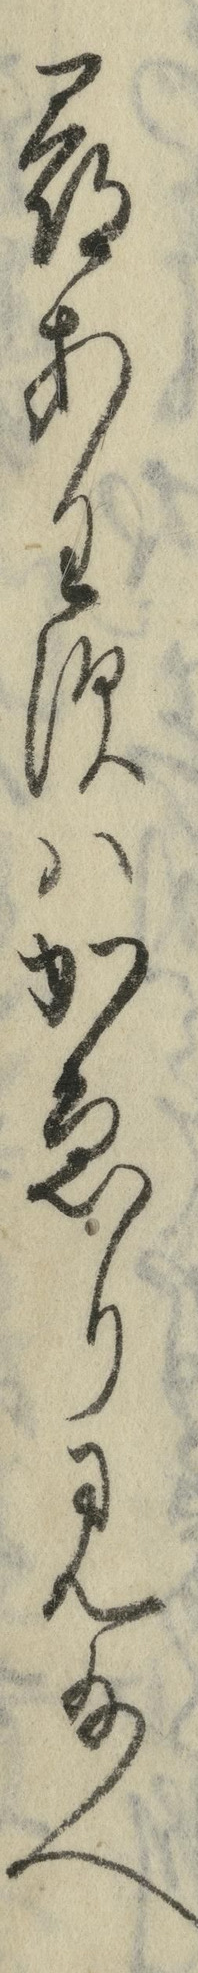尋あわすハかゑり見給へ

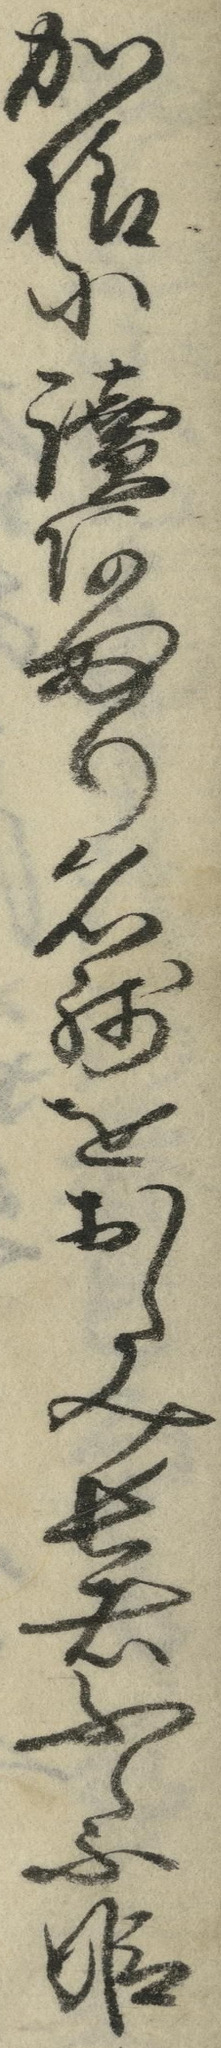か様に読あまり名残をおしみ長者ふうふ姫
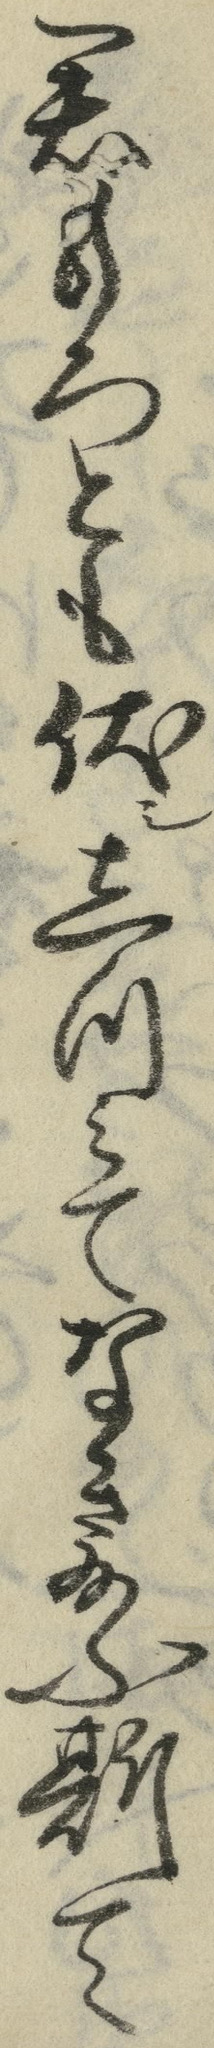君もろとも伏ししつみてなき給ふ斯て
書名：浅間記
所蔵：東京大学地震研究所図書室 Earthquake Research Institute Library, The University of Tokyo, JAPAN
